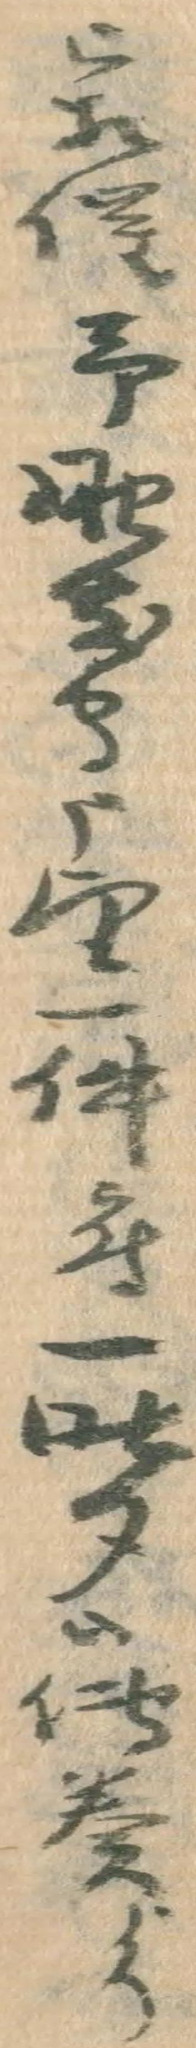被相催、予肥前守申望一件ニ付、一昨夕御伝奏より

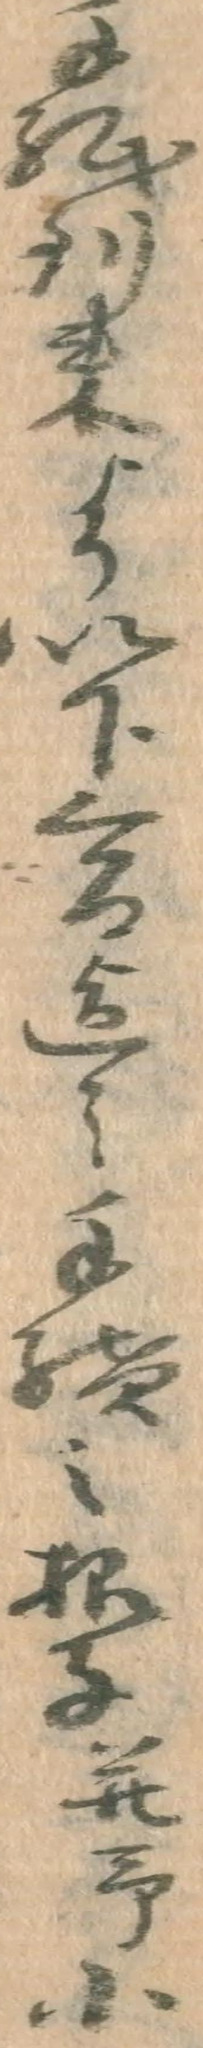手紙到来より、以下今日迄之手続之様子、并予小
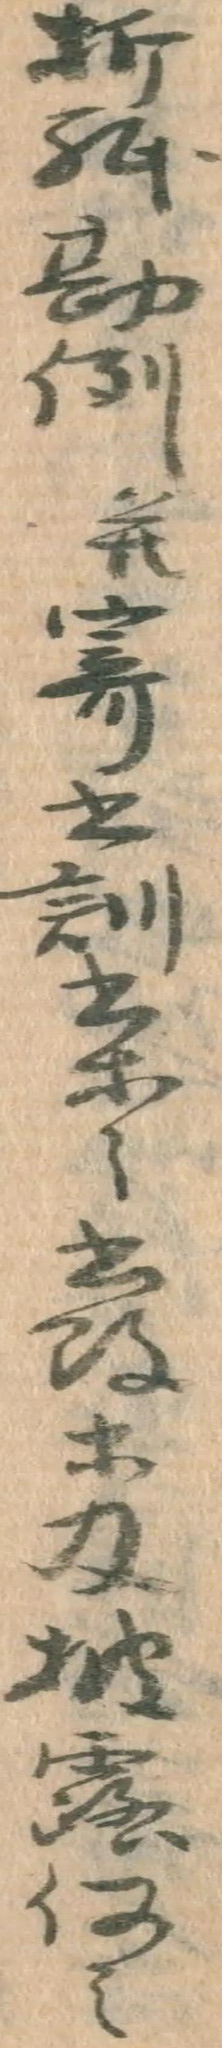折紙勘例并寄書・割書等之書改等、及披露、何之
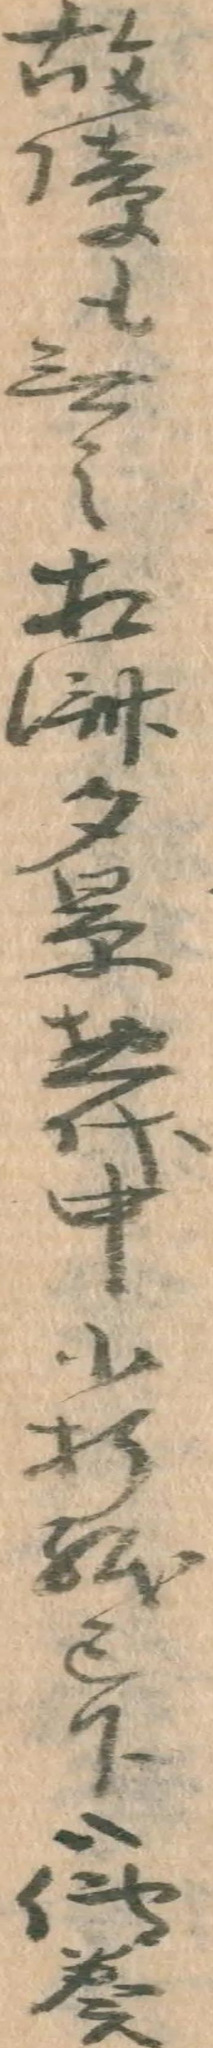故障も無之相済、夕景惣代中小折紙已下御伝奏
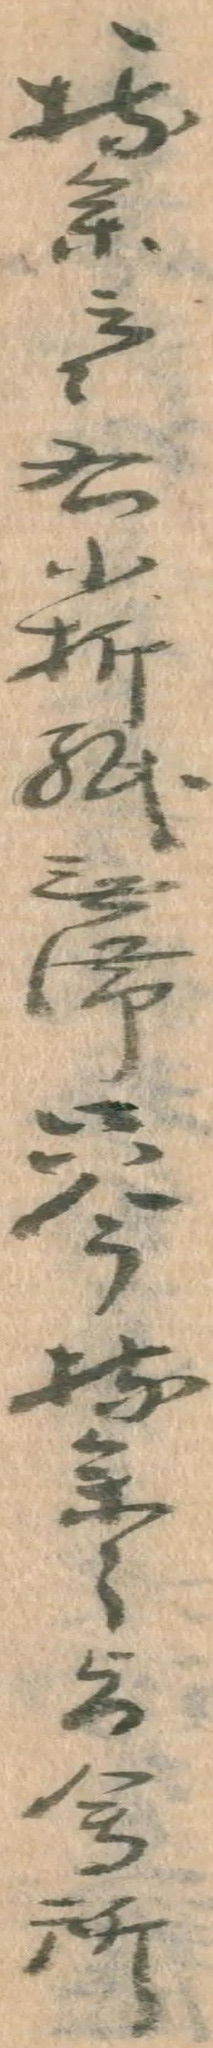へ持参云々、右小折紙無滞、只今持参之旨會所
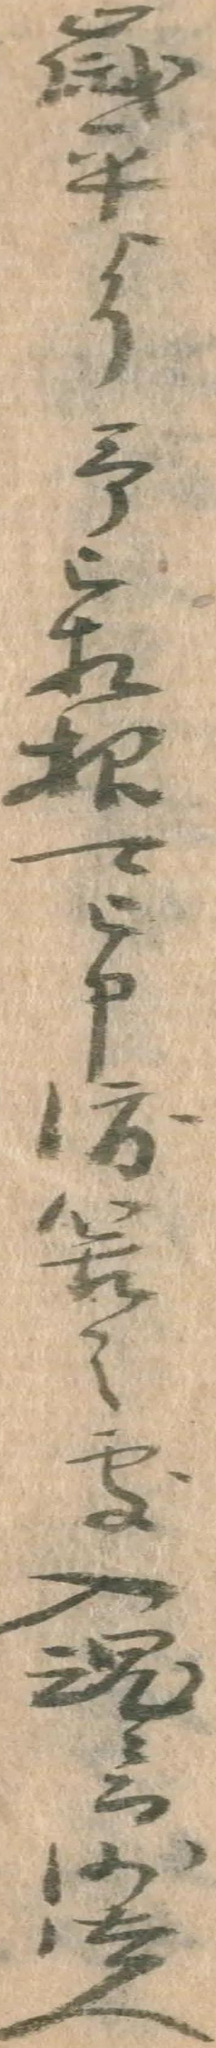歳平より予被相様可被申渡筈之處、入魂ニ而沙汰人
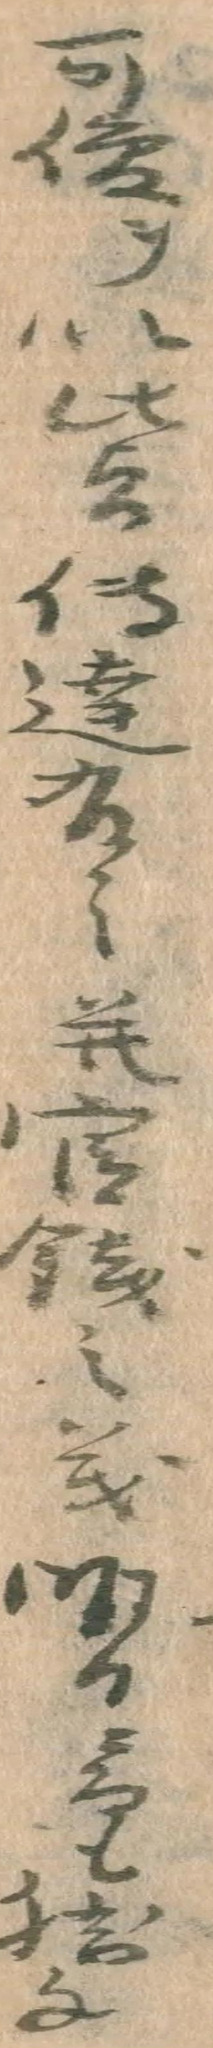可俊ヲ以此旨傳達有之、并官銭之義、明日ニ而も勝手
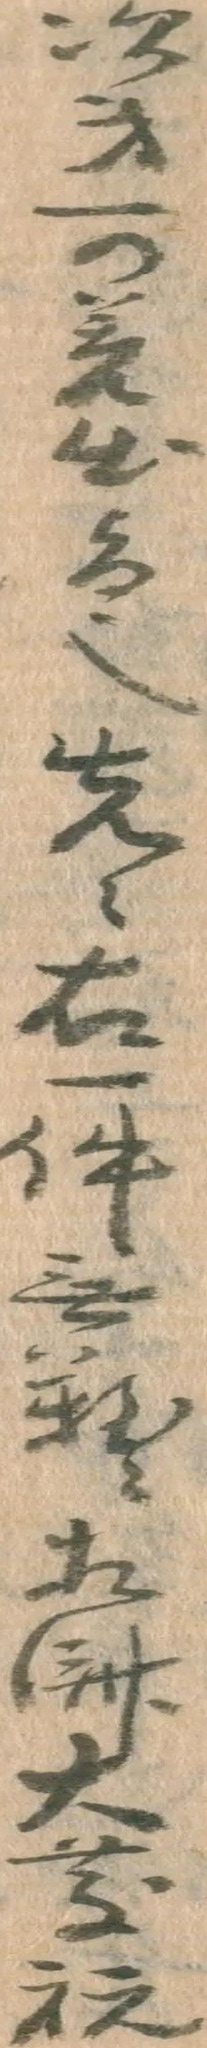次第可差出旨也、先々右一件無難ニ相済、大慶祝
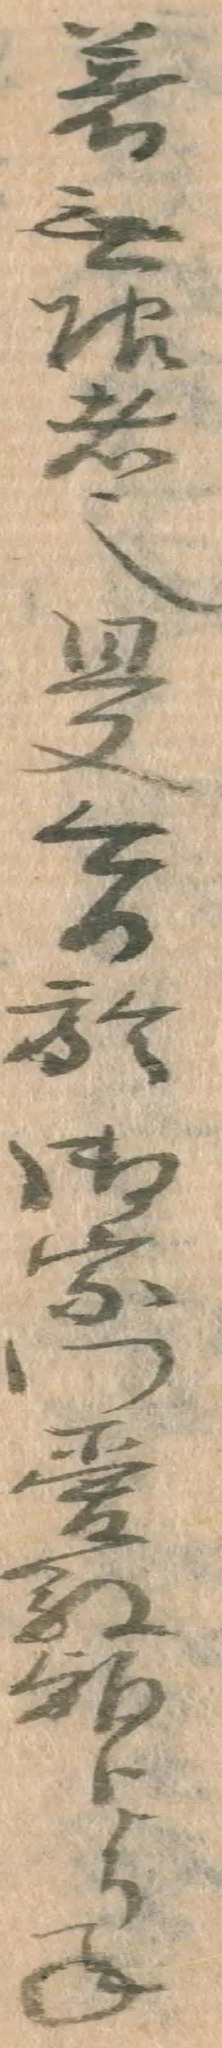着無限者也、且又今日於御家門愛敬朝臣より承、
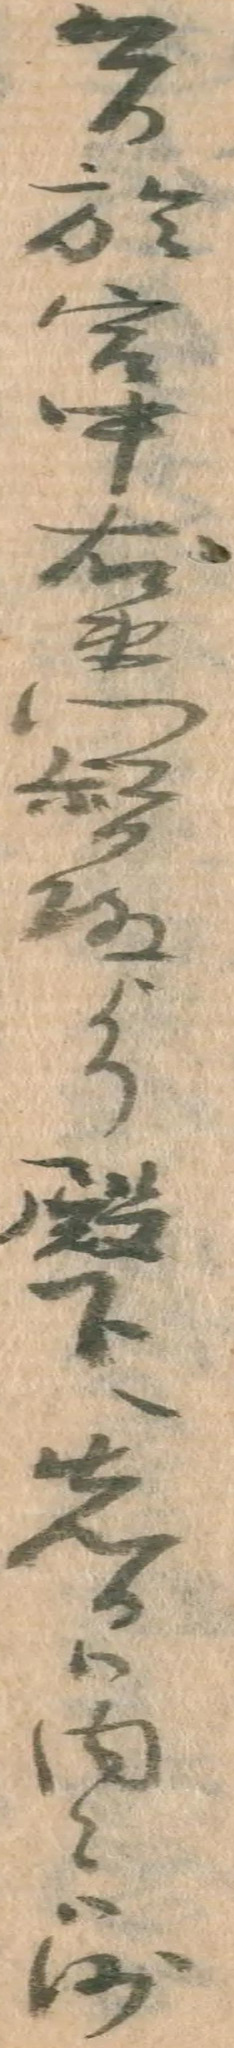今日於宮中右衛門督殿より殿下へ、先日御内々御沙
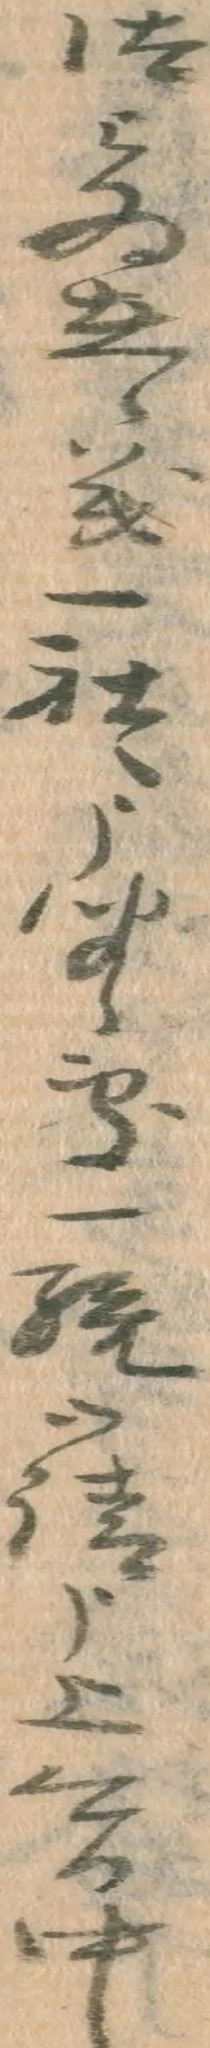汰被為在候義、一社へ申聞候處、一統御請申上、今日中
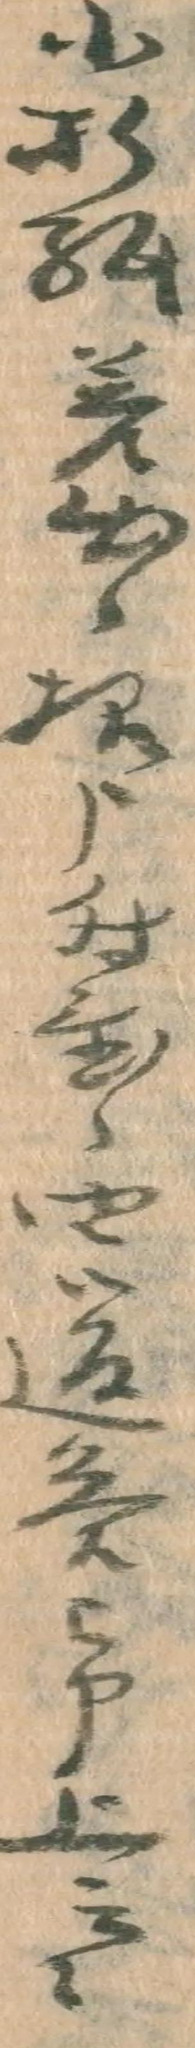小折紙差出候様申付置候由、御返答被申上云々、
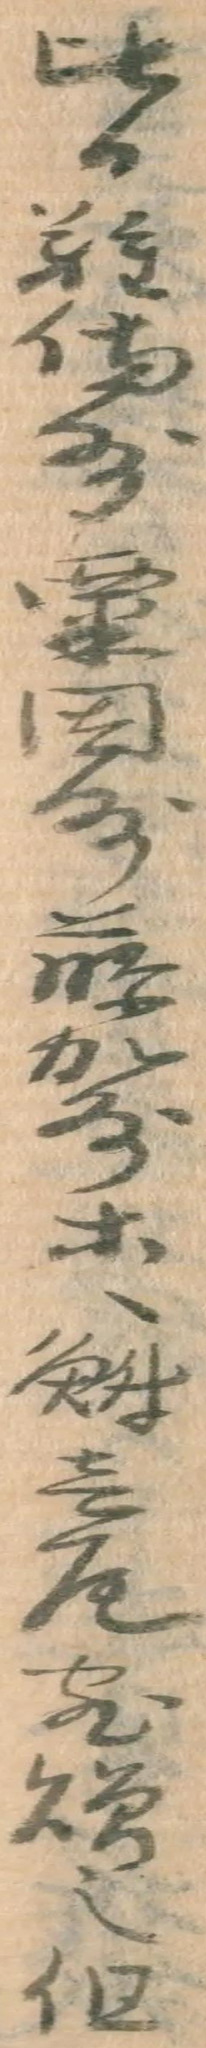昨日難備州粟因州・藤加州等へ鮒壱尾宛贈之、但
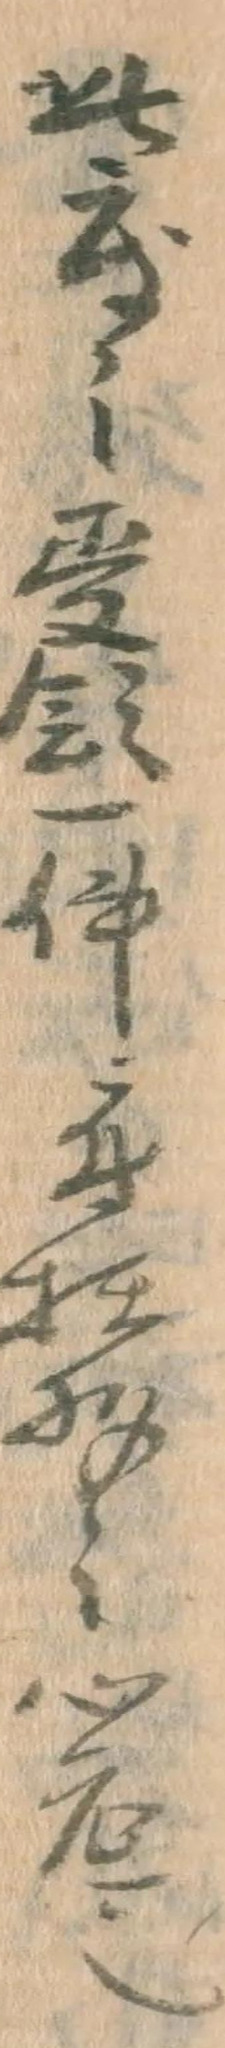此度之受領一件ニ付、挨拶之心底也、
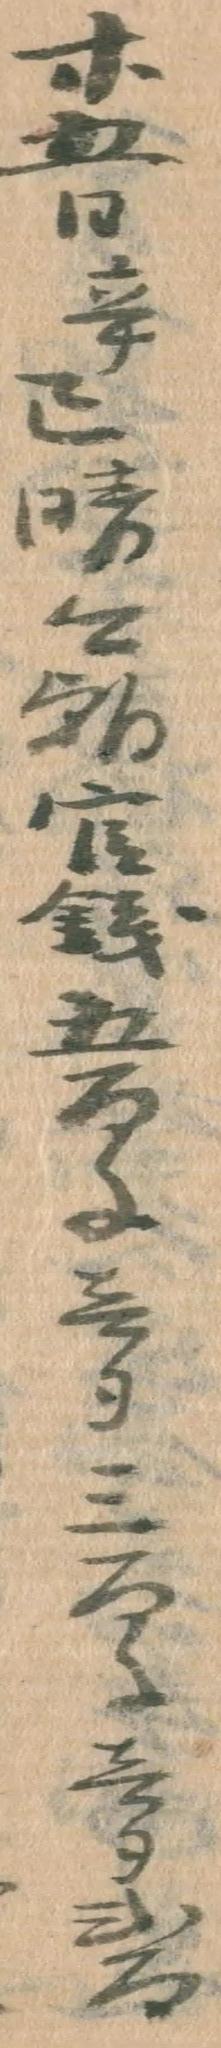廿五日辛巳晴、今朝官銭五百文壱匁三百文一匁弐百
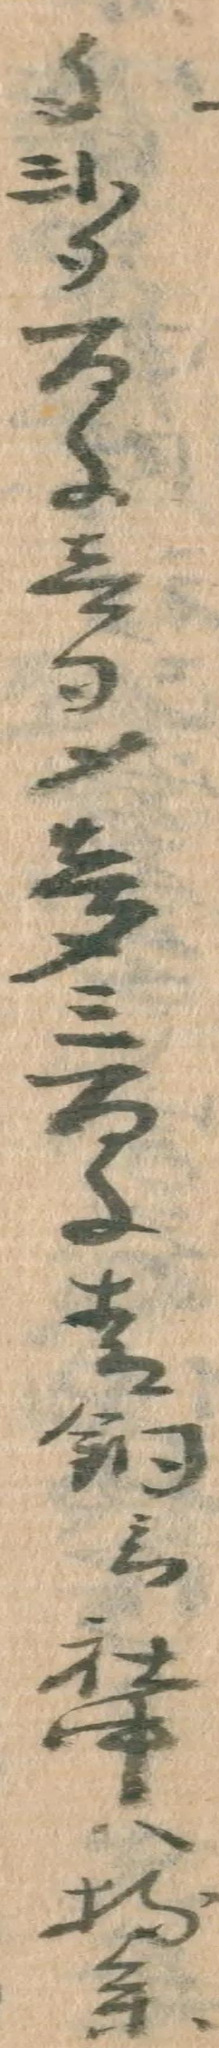文弐匁百文壱匁、〆壱〆三百文青銅に而社中へ持参、
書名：賀茂社記録. 第63冊
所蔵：国立国会図書館 National Diet Library, JAPAN
